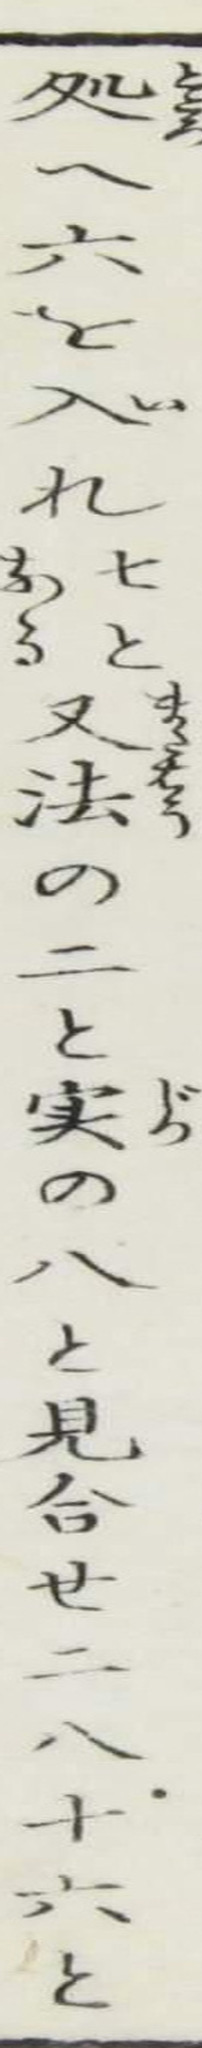処へ六を入れ七となる又法の二と実の八と見合せ二八．十六と
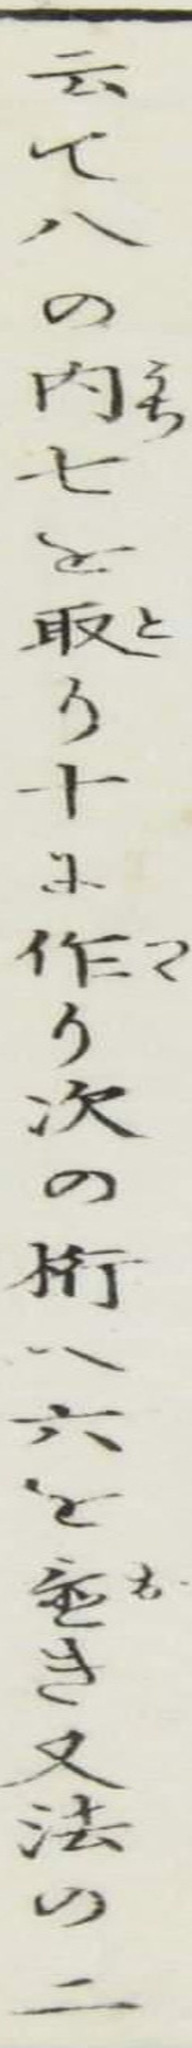云て八の内七を取り十に作り次の桁へ六を置き又法の二
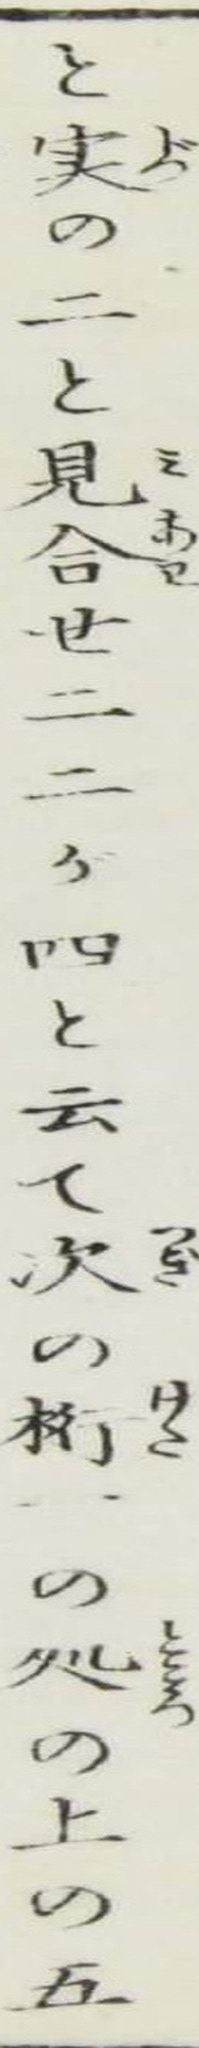と実の二と見合せに二二が四と云て次の桁一の処の上の五
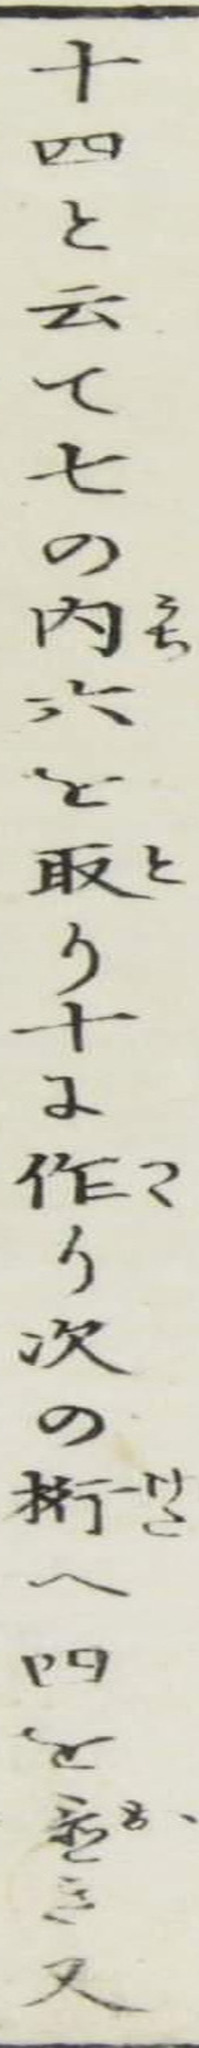十四と云て七の内六を取り十に作り次の桁へ四を置き又
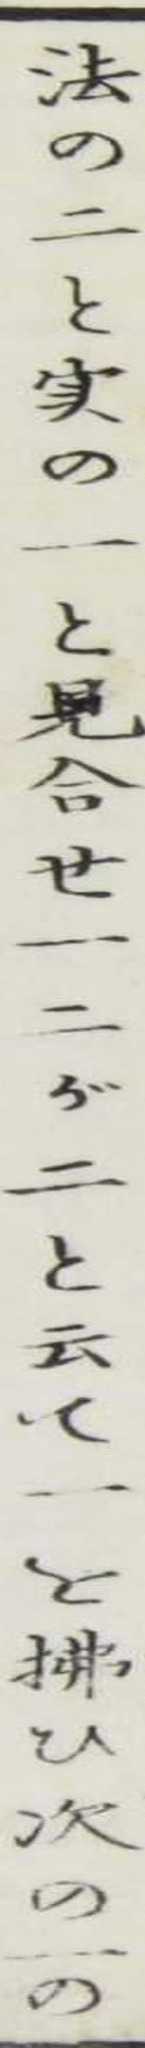法の二と実の一と見合せ一二が二と云て一を払ひ次の一の
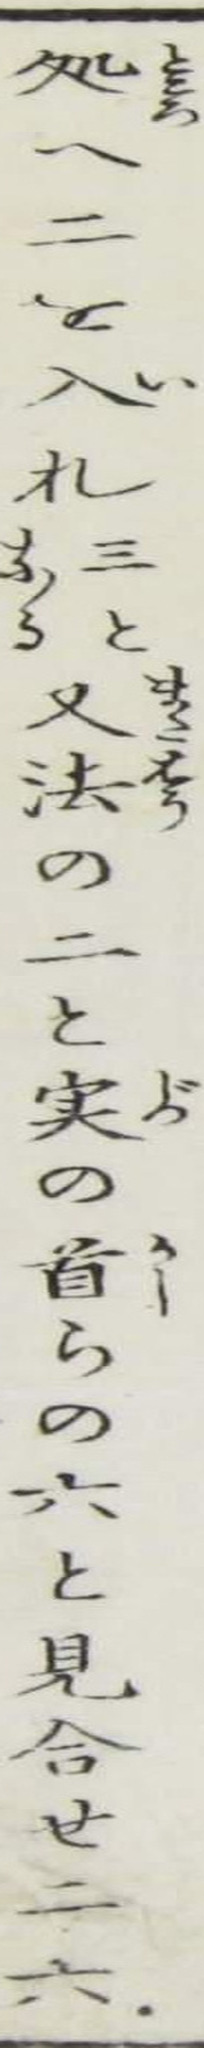処へ二を入れ三となる又法の二と実の首らの六と見合せ二六．
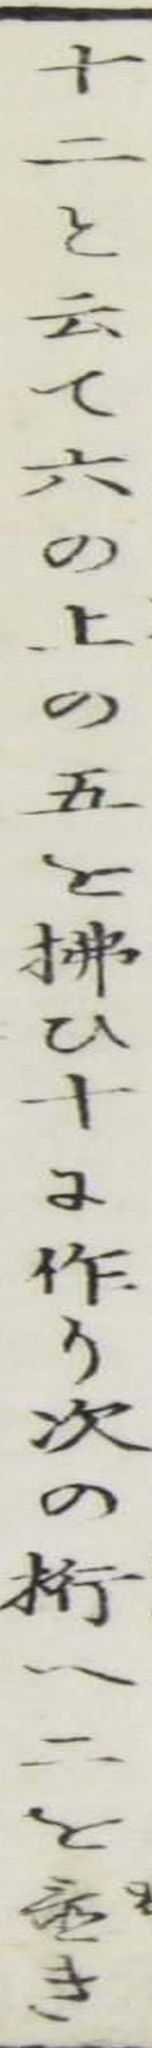十二と云て六の上の五を払ひ十に作り次の桁へ二を置き
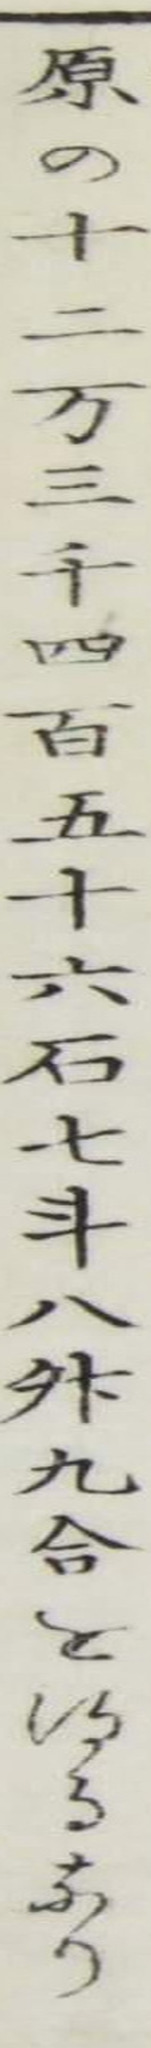原の十二万三千四百五十六石七斗八升九合を得るなり

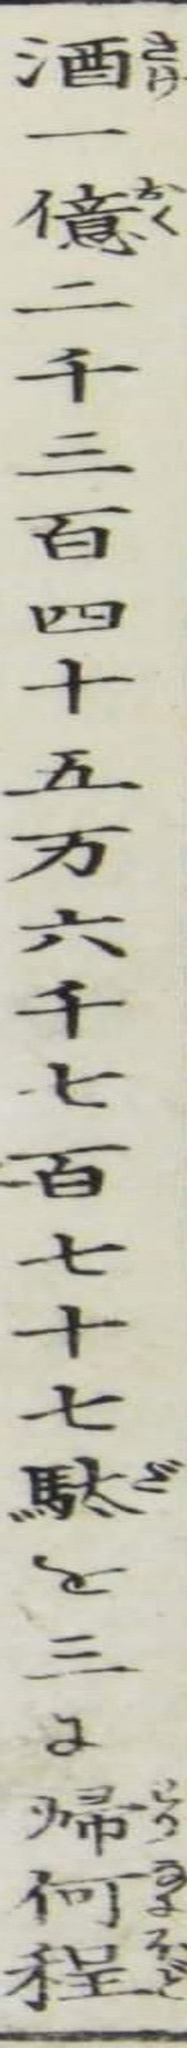酒一億二千三百四十五万六千七百七十七駄を三に帰何程
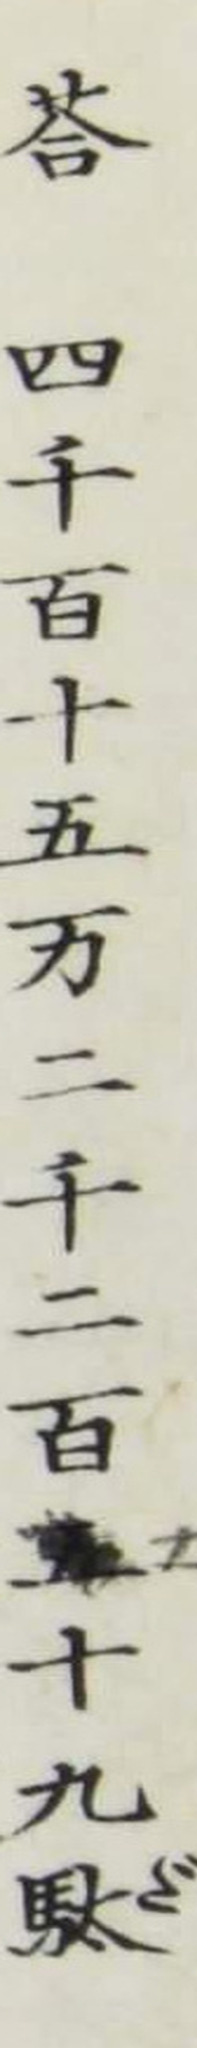答四千百十五万二千二百五十九駄
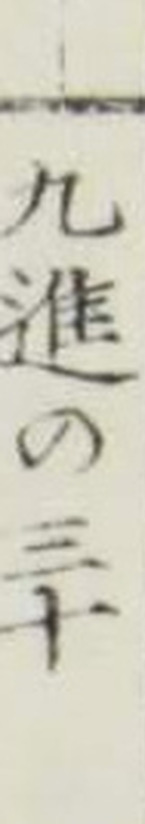九進の三十
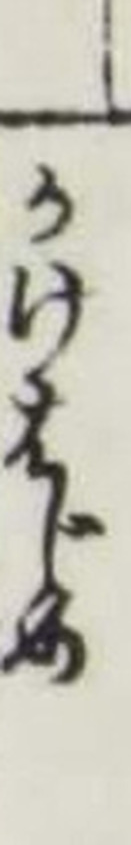わりはじめ
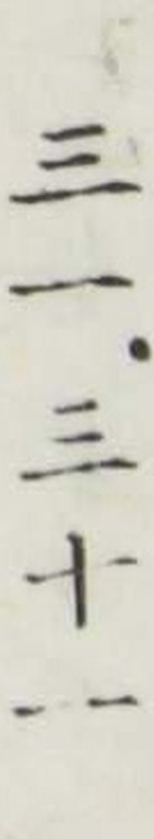三一．三十一
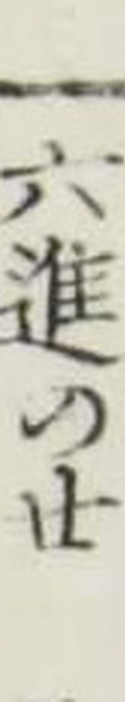六進の廿
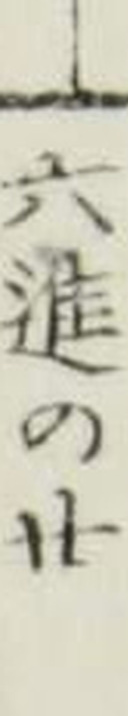六進の廿
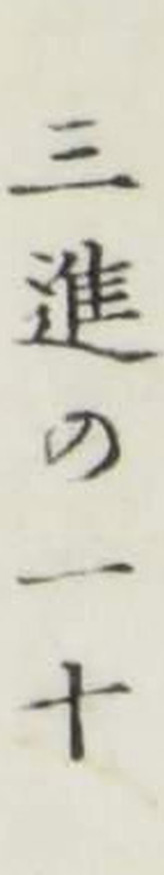三進の一十
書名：明治小學塵劫記 卷1
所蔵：東京学芸大学教育コンテンツアーカイブ
